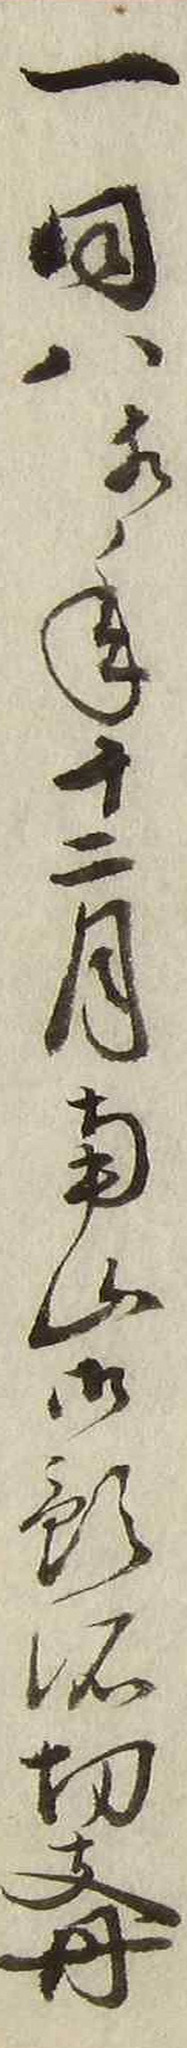一同八卯年十二月南山御預所切文丹
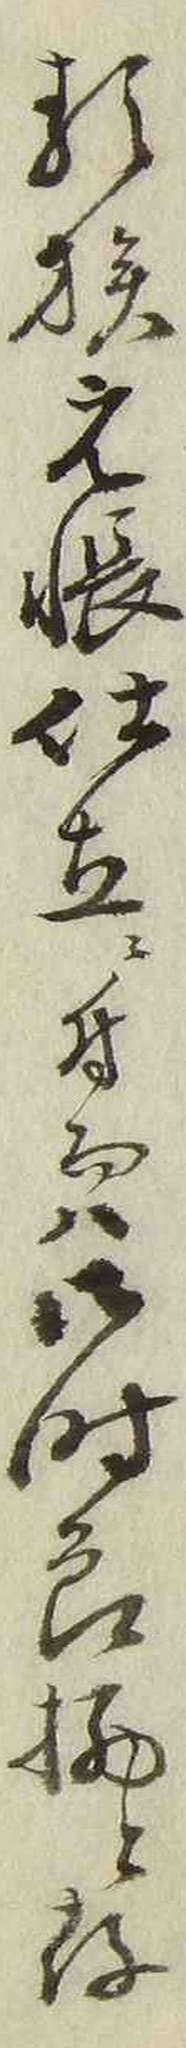類族元帳仕立ニ付而ハ御時節柄と存

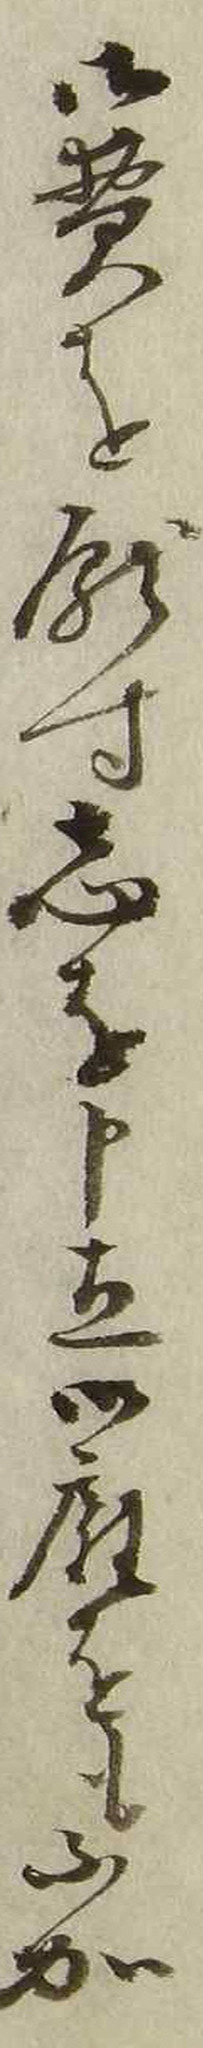御費を厭寸志を申立御雇をも不加
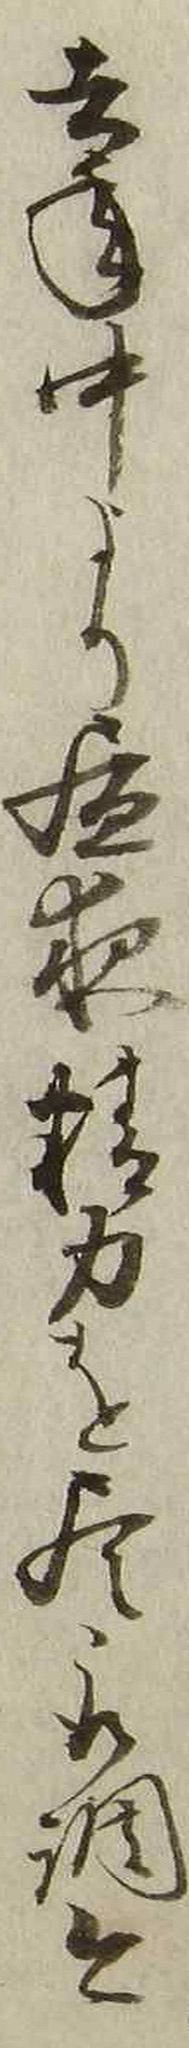去年中より昼夜精力を尽取調今
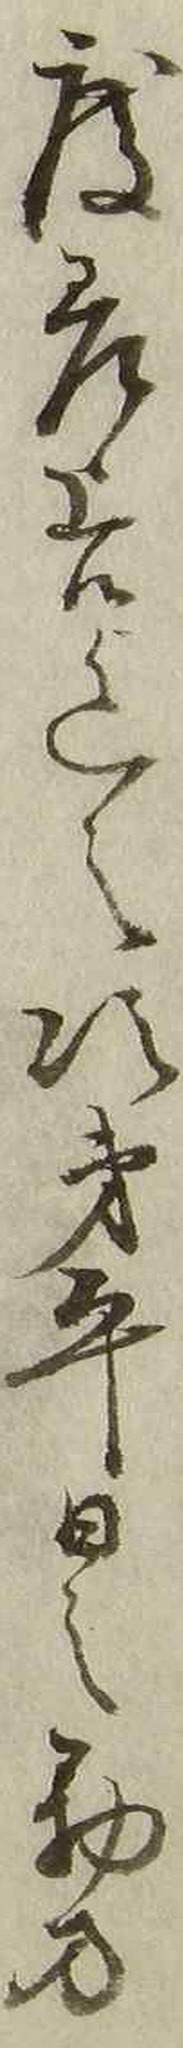度差上候迄之次第平日之勤方
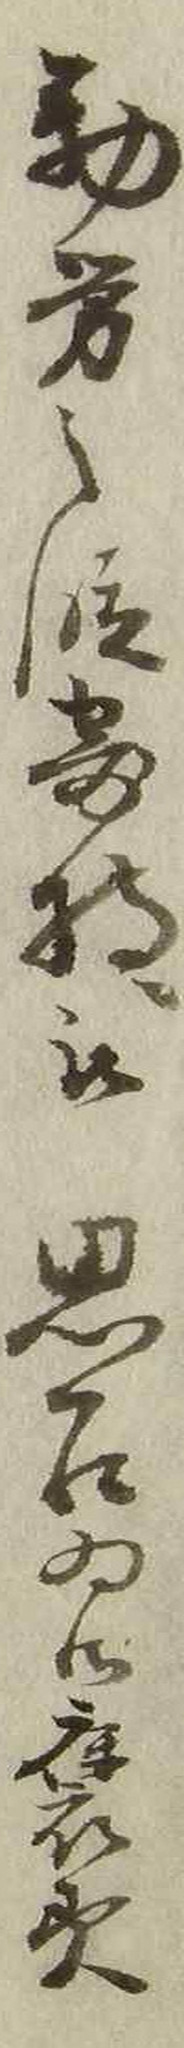勤労之段寄特ニ被思召為御褒美
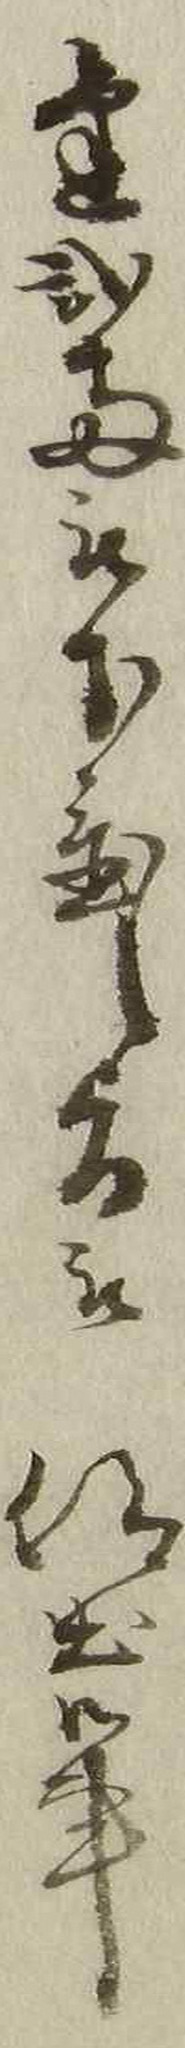金弐両被下置之旨被仰出候事
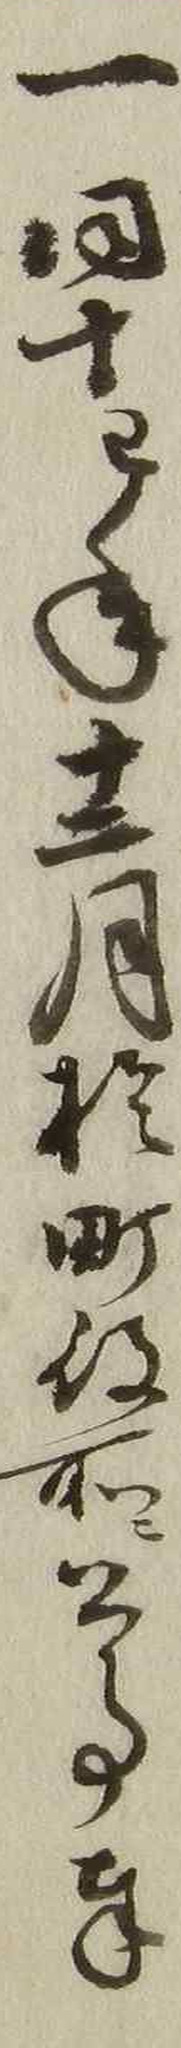一同十巳年十二月於町役所ニ公事奉
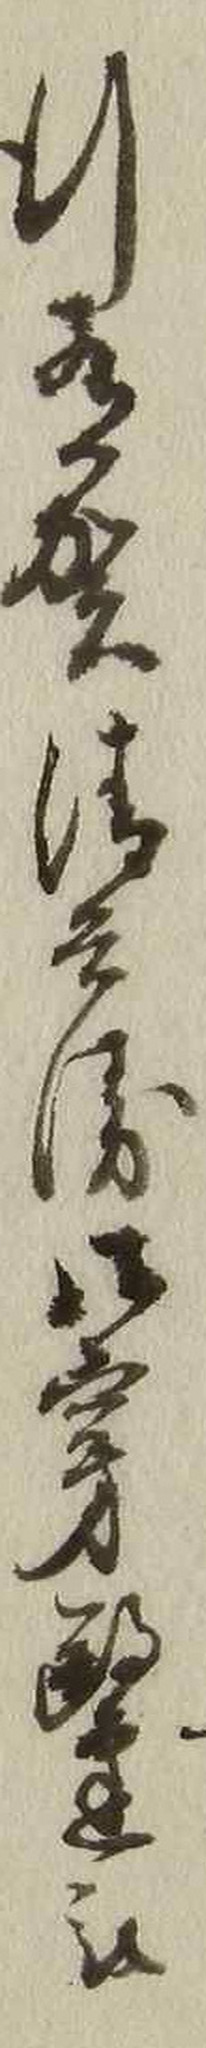行有賀清兵衛御穿鑿被
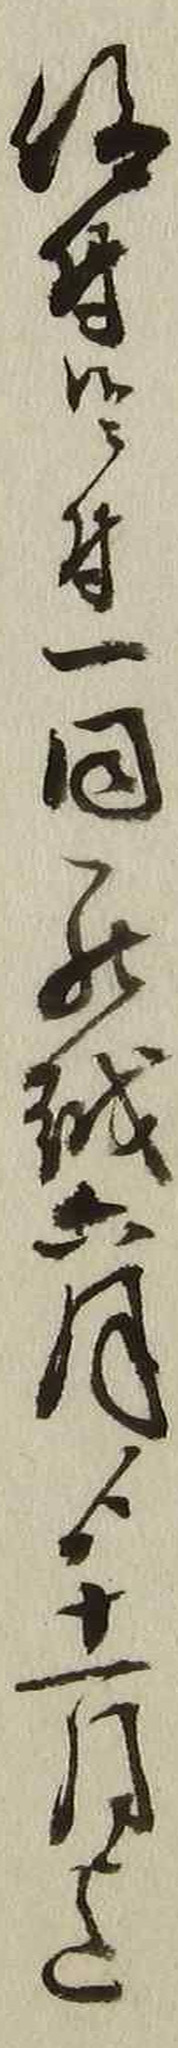仰付候ニ付一同罷越六月ゟ十一月迄
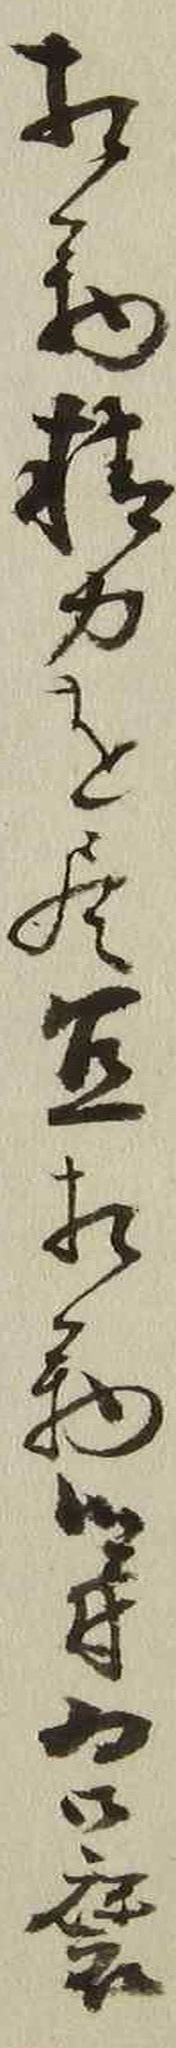相勤精力を尽宜相勤候ニ付為御褒
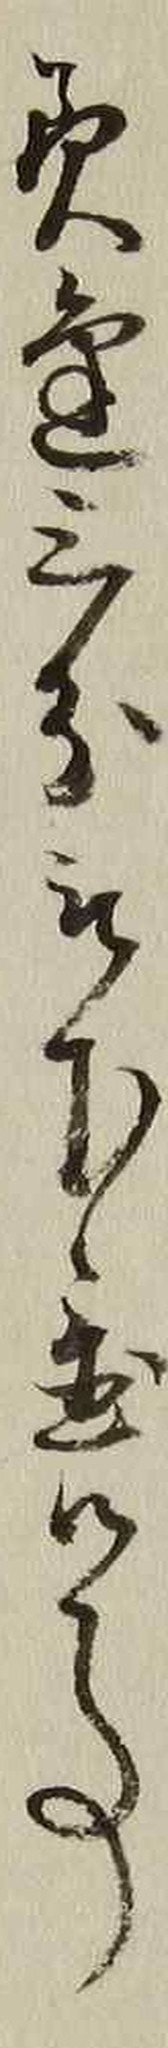美金三分被下置候事
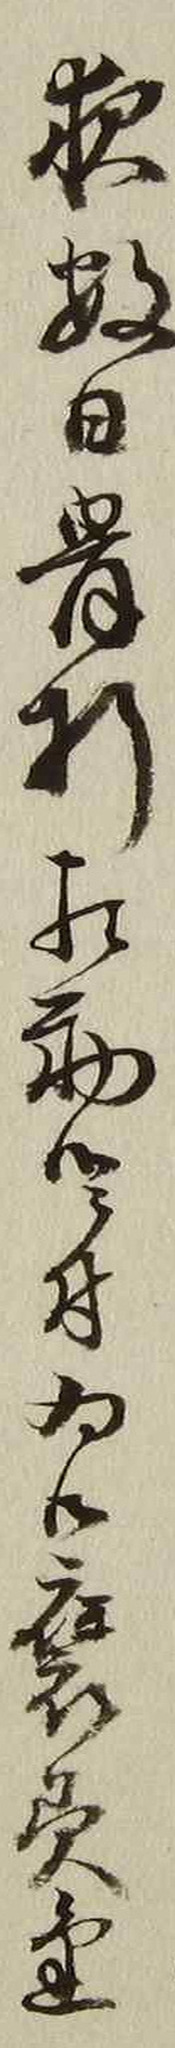夜数日骨折相勤候ニ付為御褒美金
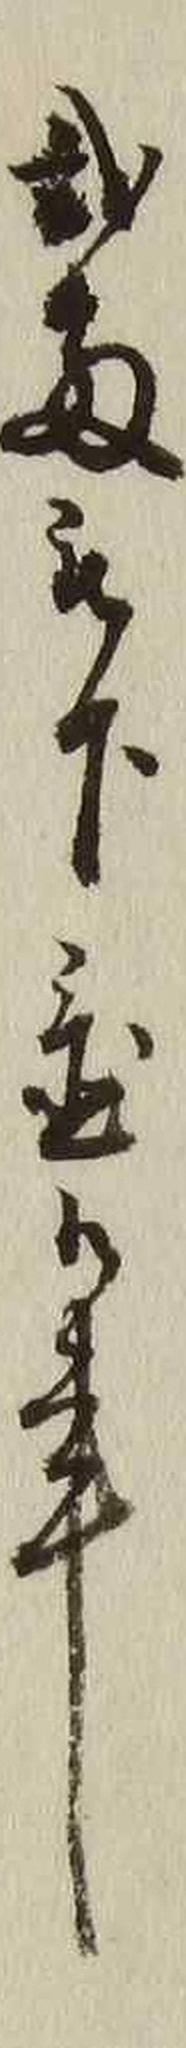弐両被下置候事
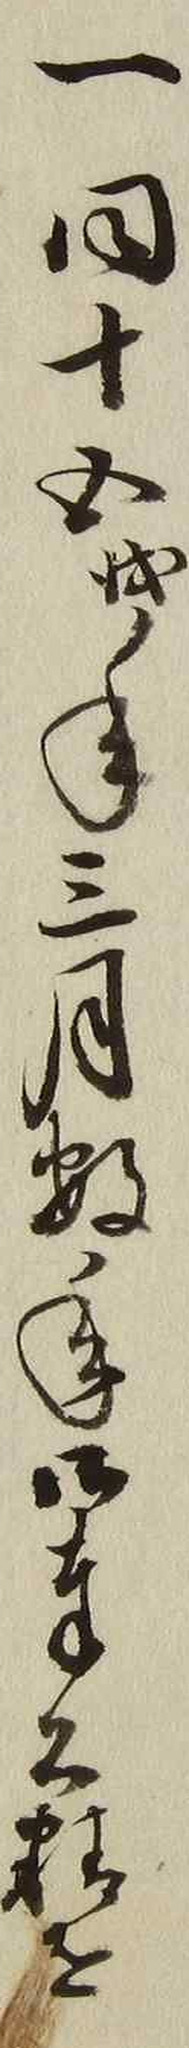一同十五戌年三月数年御奉公精を
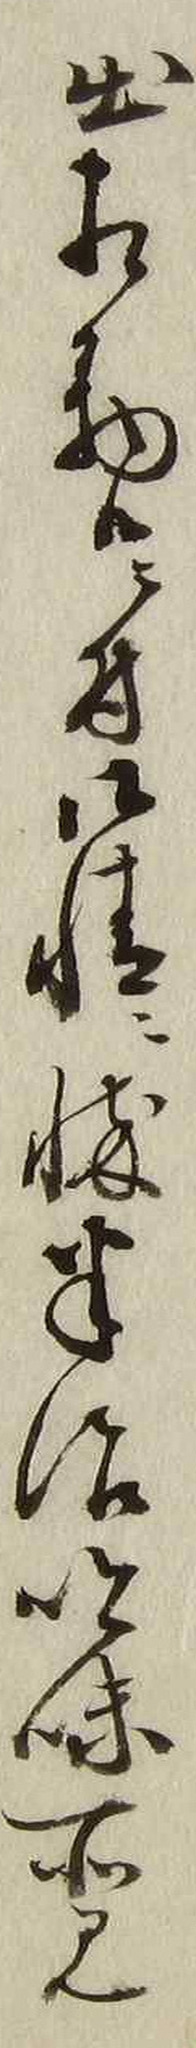出相勤候ニ付御情ニ忰半治吟味所見
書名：諸士系譜　巻之39　は之部7
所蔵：会津若松市立会津図書館
